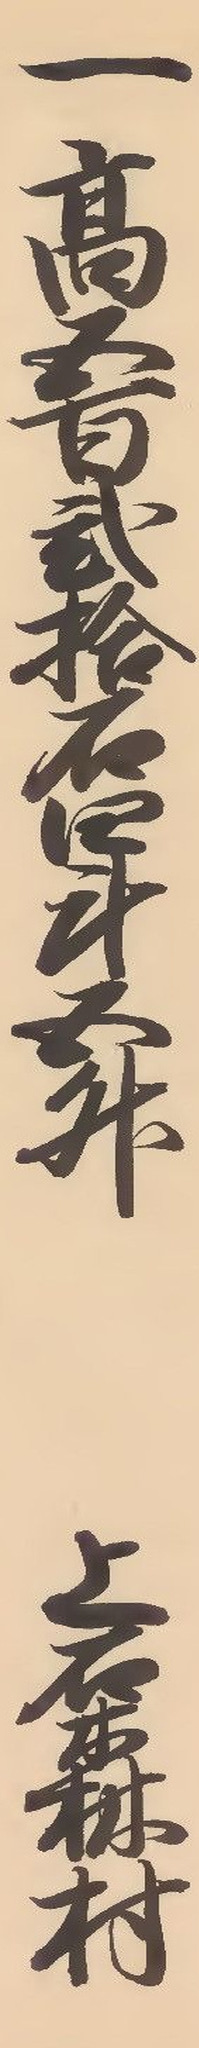一高五百弐拾石四斗五升上石森村
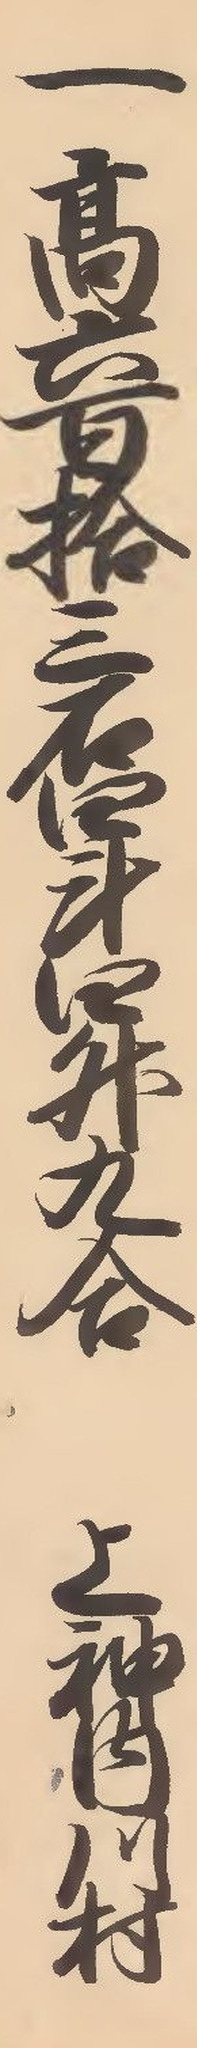一高六百拾三石四斗四升九合上神内川村
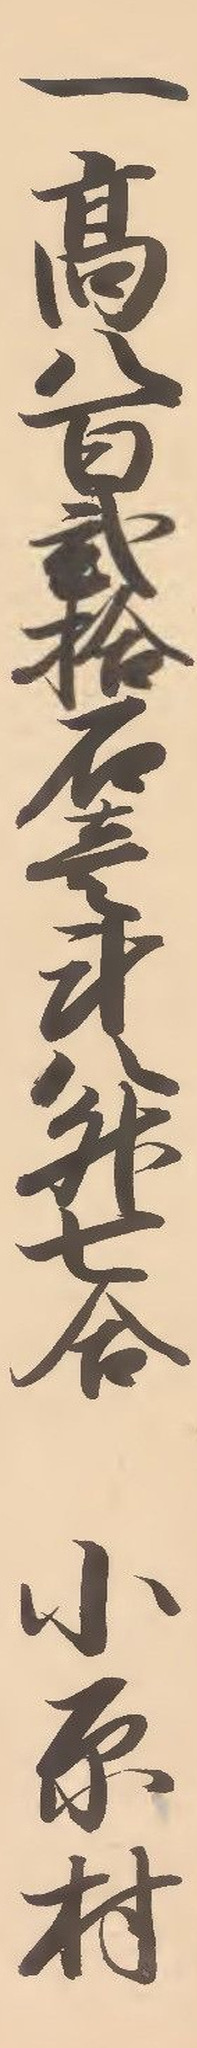一高八百弐拾石壱斗八升七合小原村
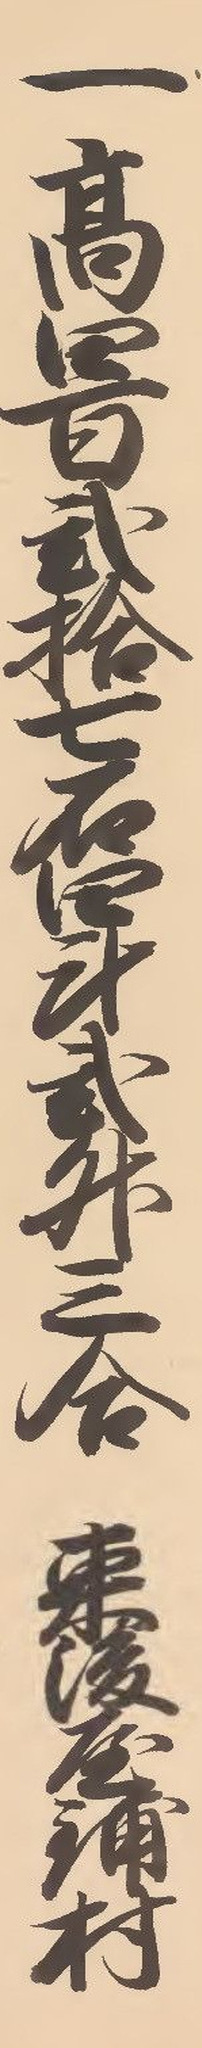一高四百弐拾七石四斗弐升三合東後屋鋪村
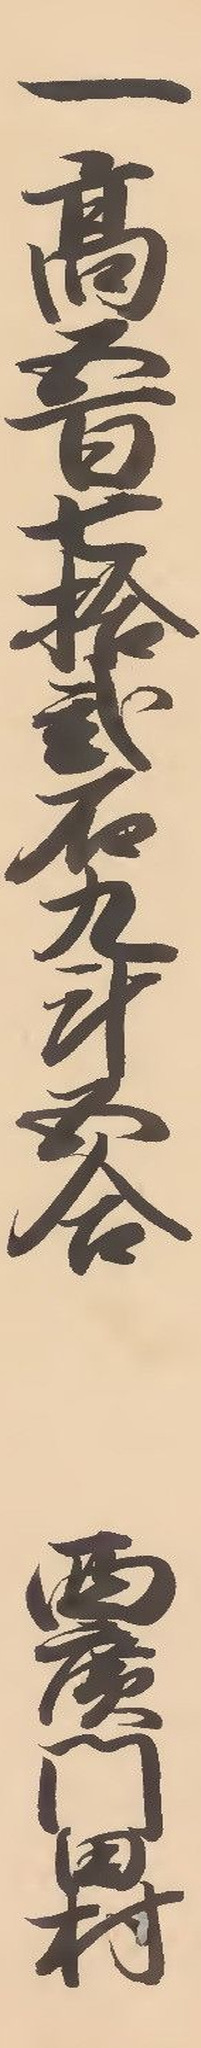一高五百七拾弐石九斗五合西広門田村
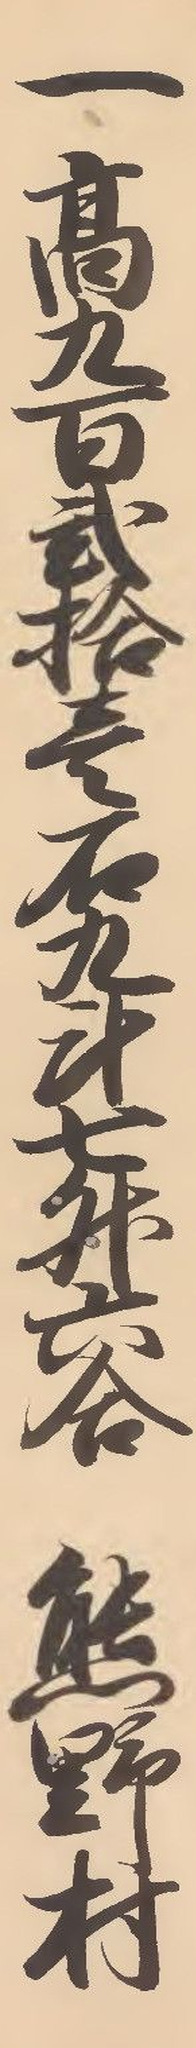一高九百弐拾壱石九斗七升六合熊野村

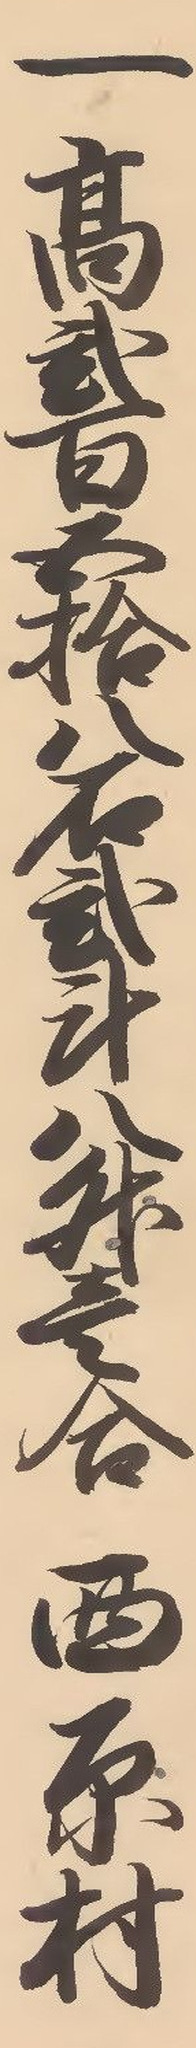一高弐百五拾八石弐斗八升壱合西原村
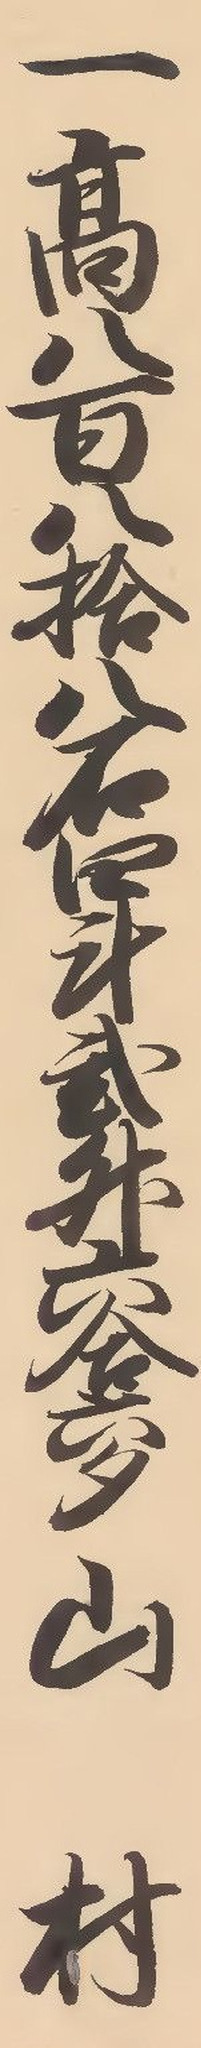一高八百八拾八石四斗弐升六合六勺山村
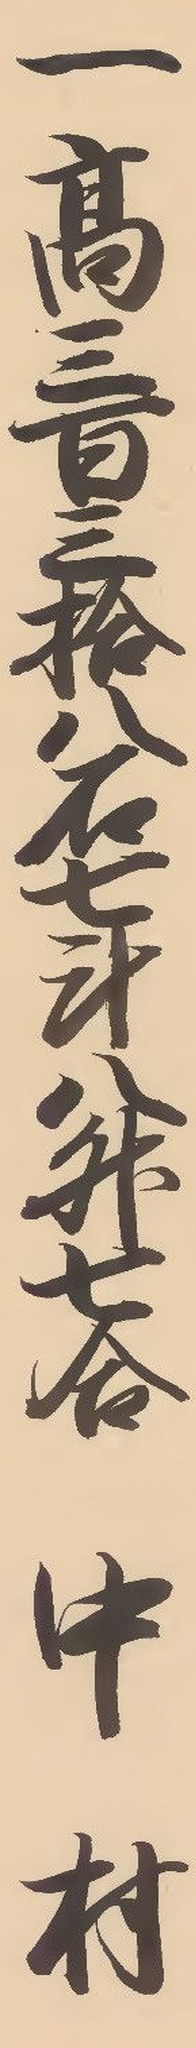一高三百三拾八石七斗八升七合中村
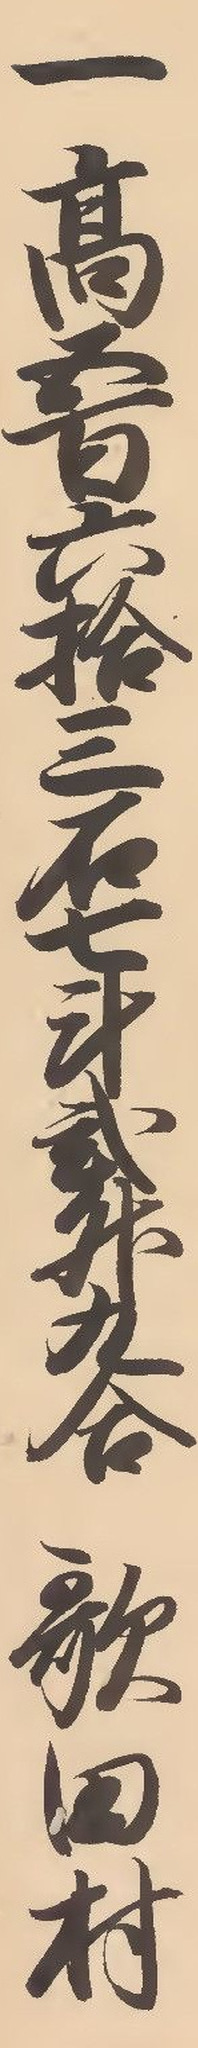一高五百六拾三石七斗弐升九合歌田村
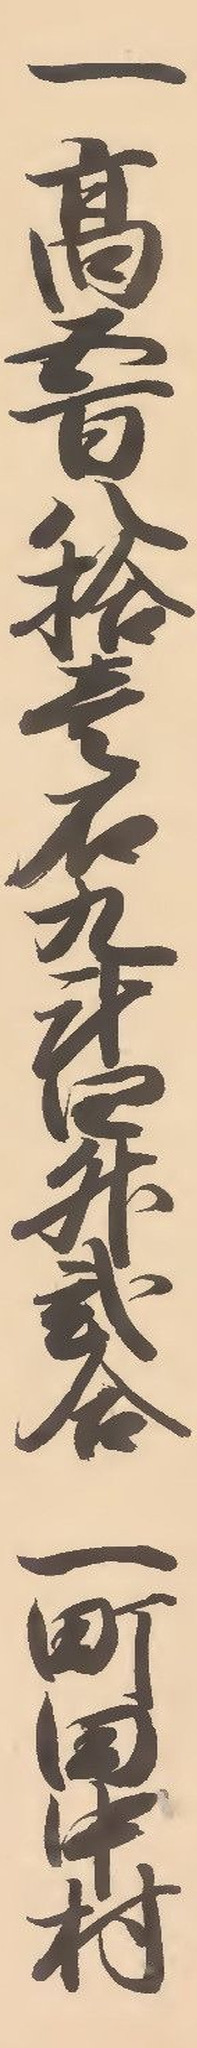一高五百八拾壱石九斗四升弐合一町田中村
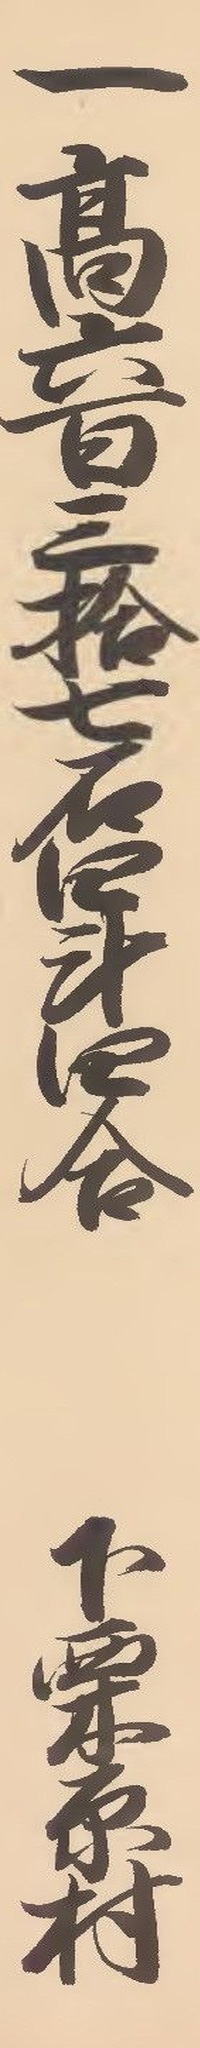一高六百三拾七石四斗四合下栗原村
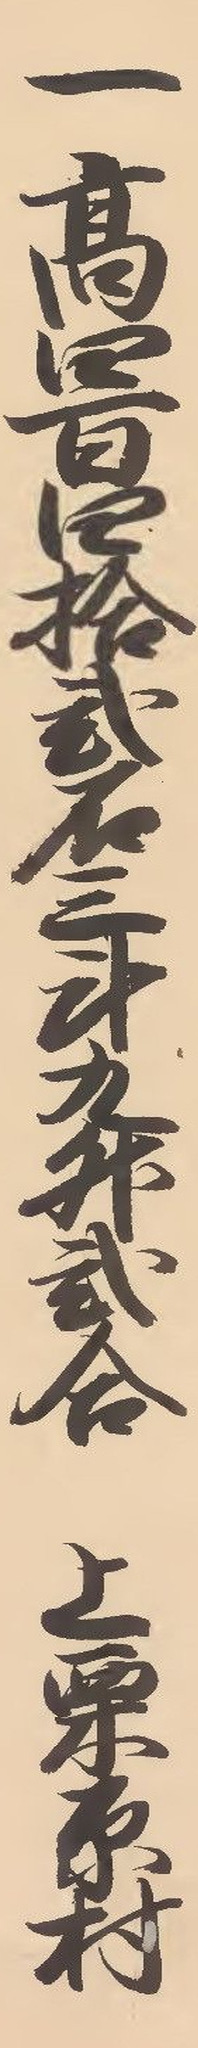一高四百四拾弐石三斗九升弐合上栗原村
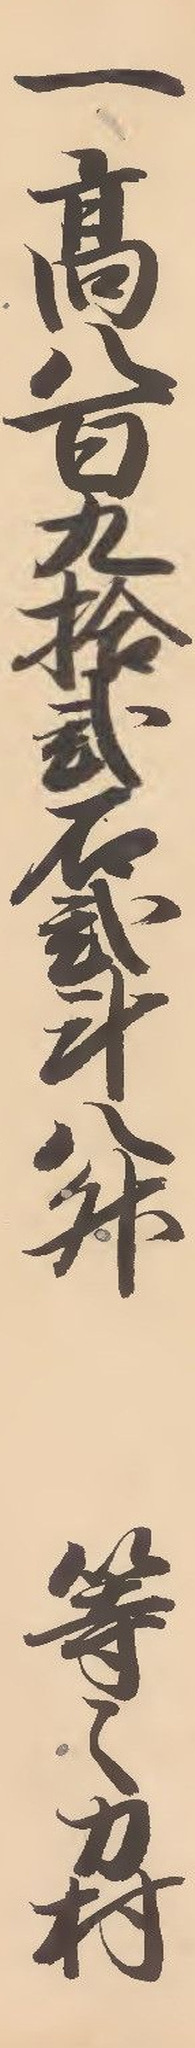一高八百九拾弐石弐斗八升等々力村

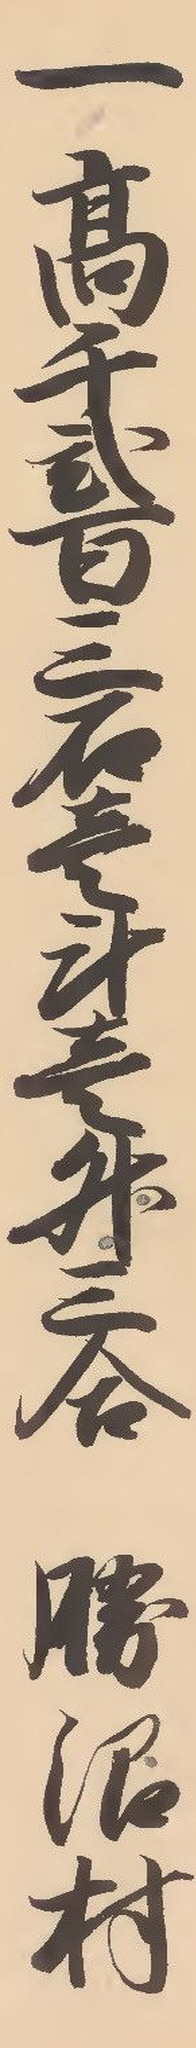一高千弐百三石壱斗壱升三合勝沼村
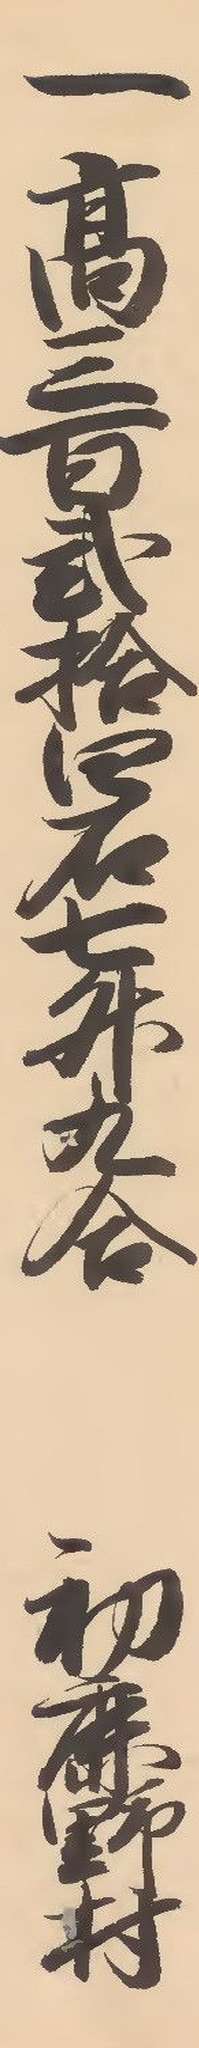一高三百弐拾四石七升九合初鹿野村
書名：甲斐国郷帳
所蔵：国立公文書館 National Archives of Japan
